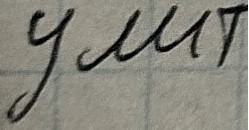улит
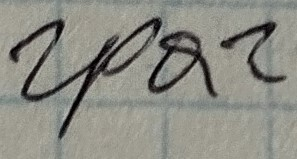грач
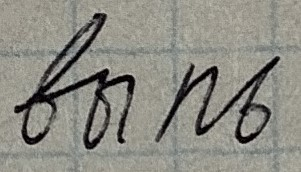выпь
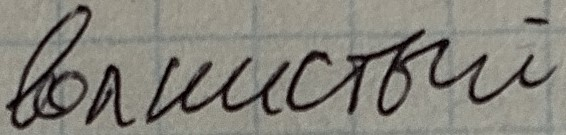волнистый
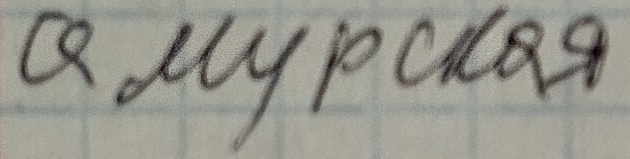амурская
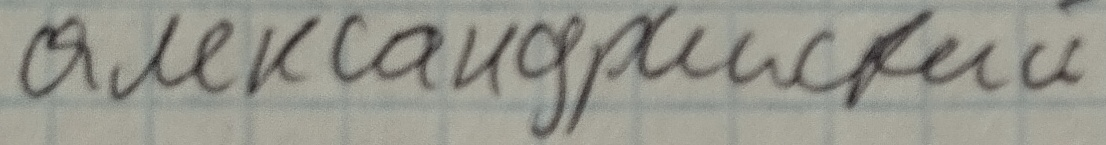александрииский
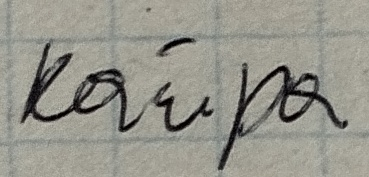кайра
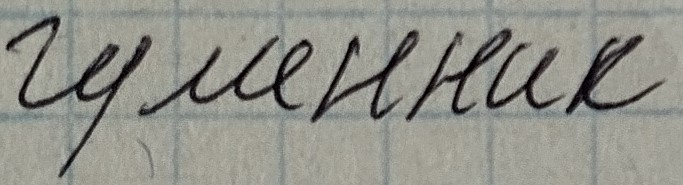гуменник
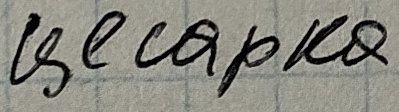цесарка
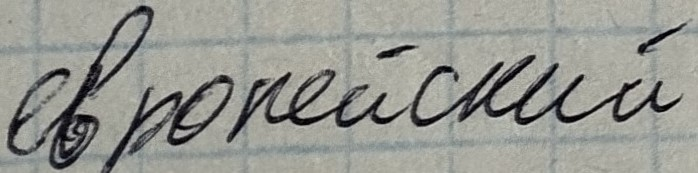европейский
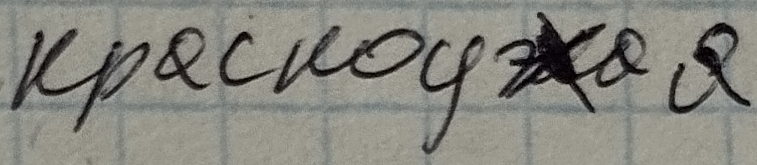красноухая
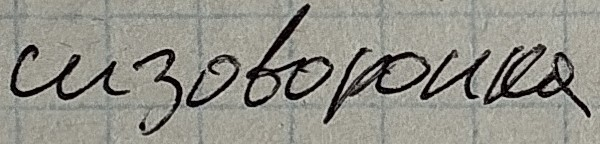сизоворонка
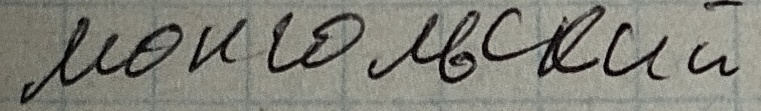монгольский
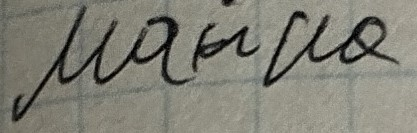майна
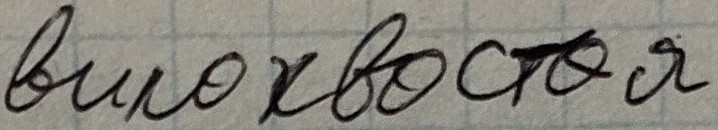вилохвостоя
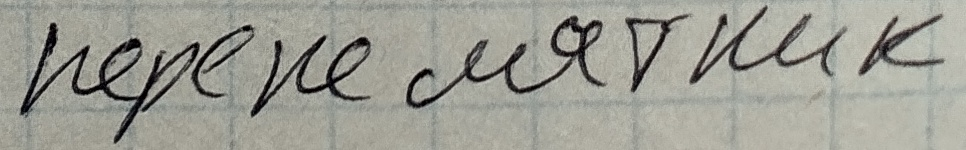перепелятник
